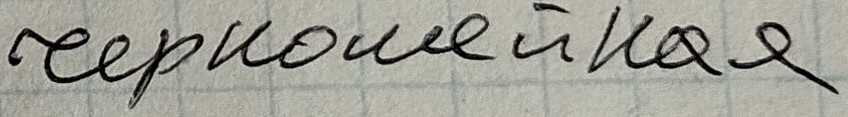черношейная
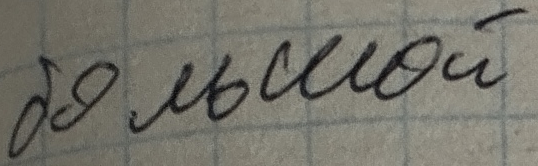большой
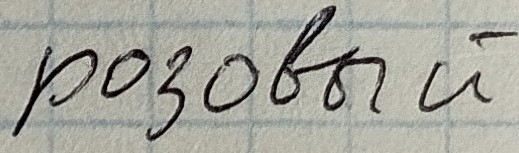розовый
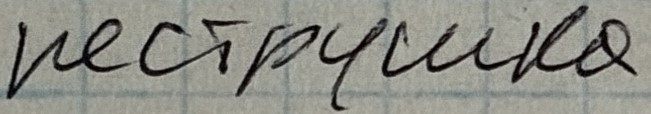пеструшка
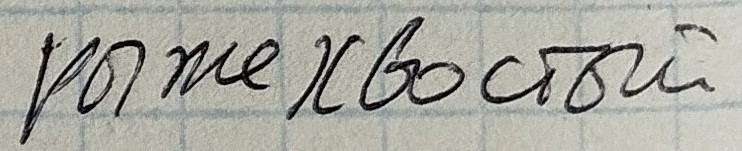рыжехвостый
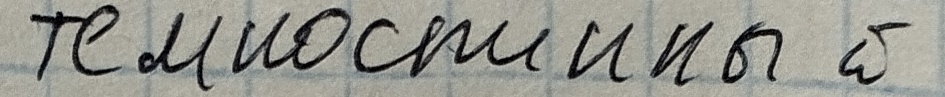темноспинный
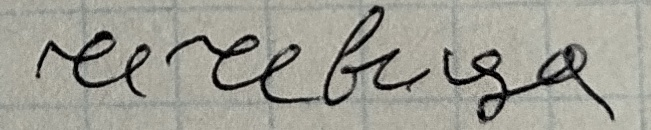чечевица
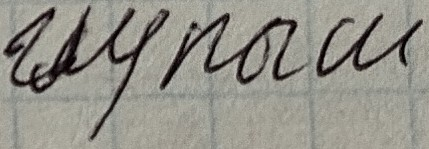глупыш
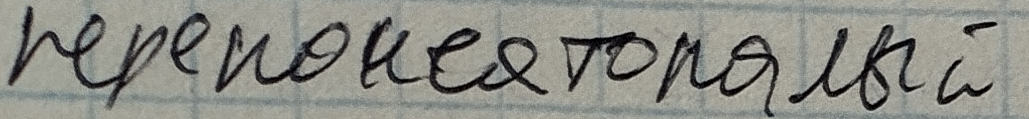перепончатопалый
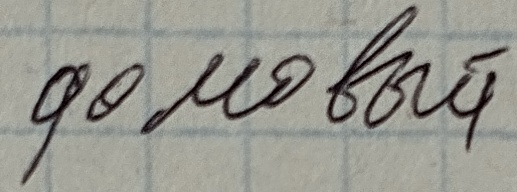домовый
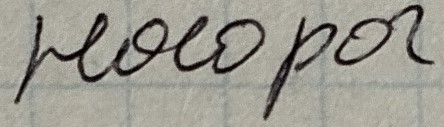носорог
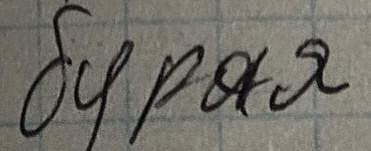бурая
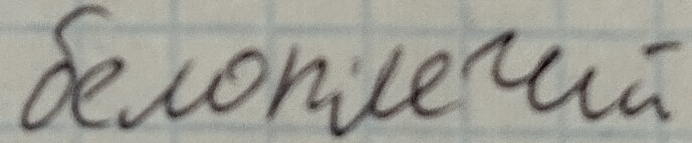белоплечий
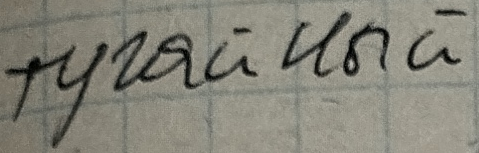тугайный
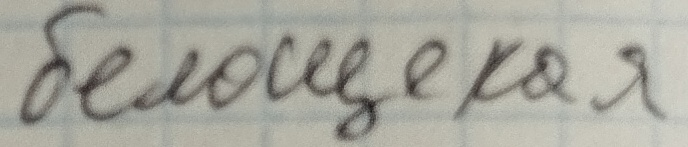белощекая
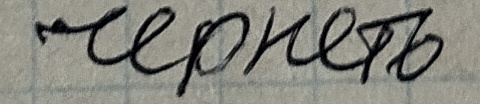чернеть
